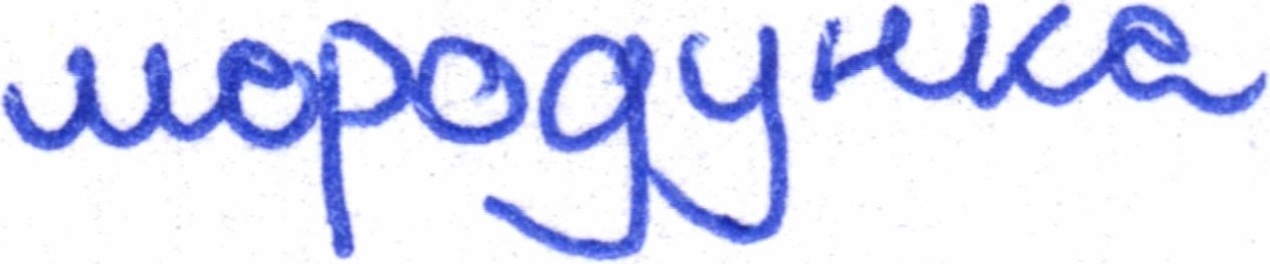мородунка
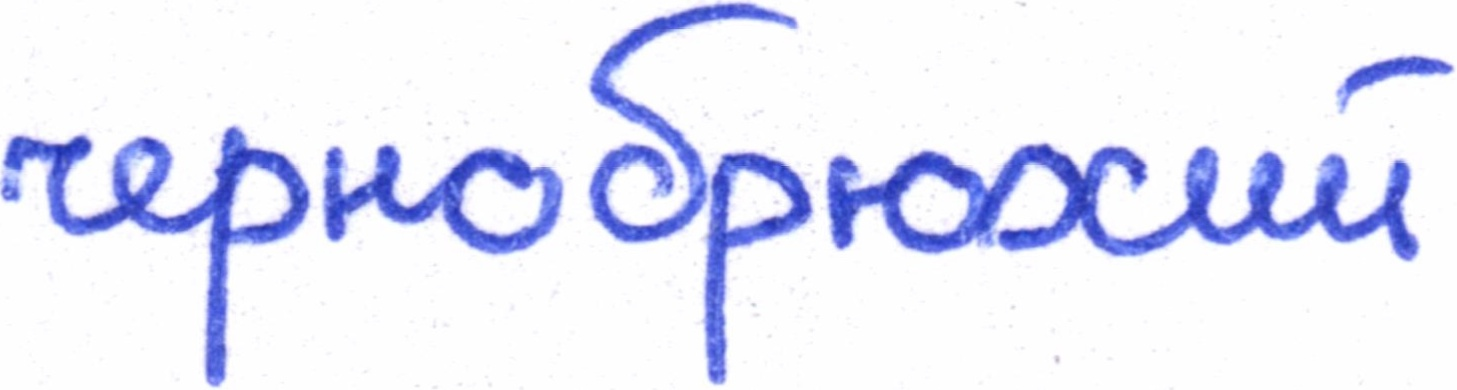чернобрюхий
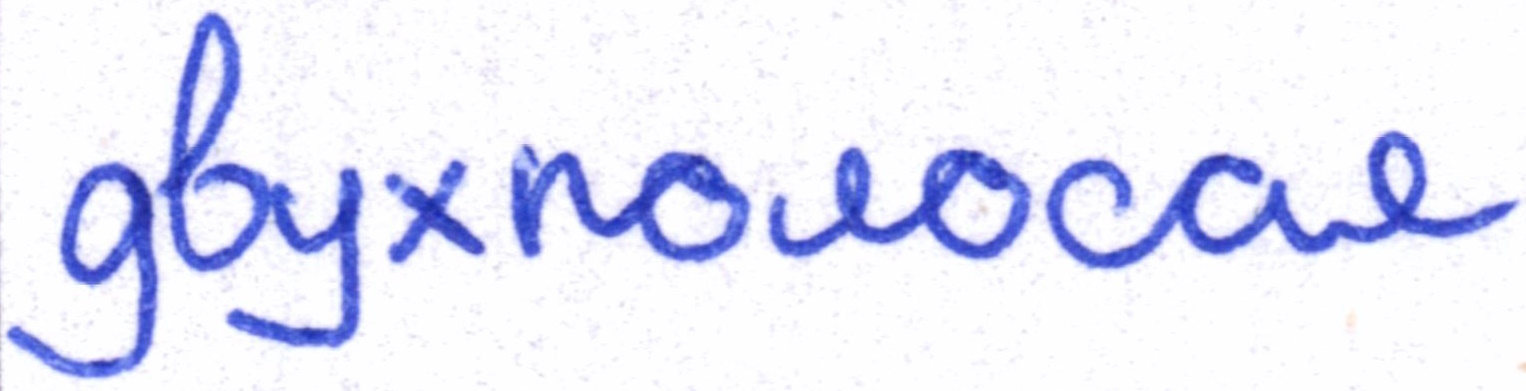двухполосая
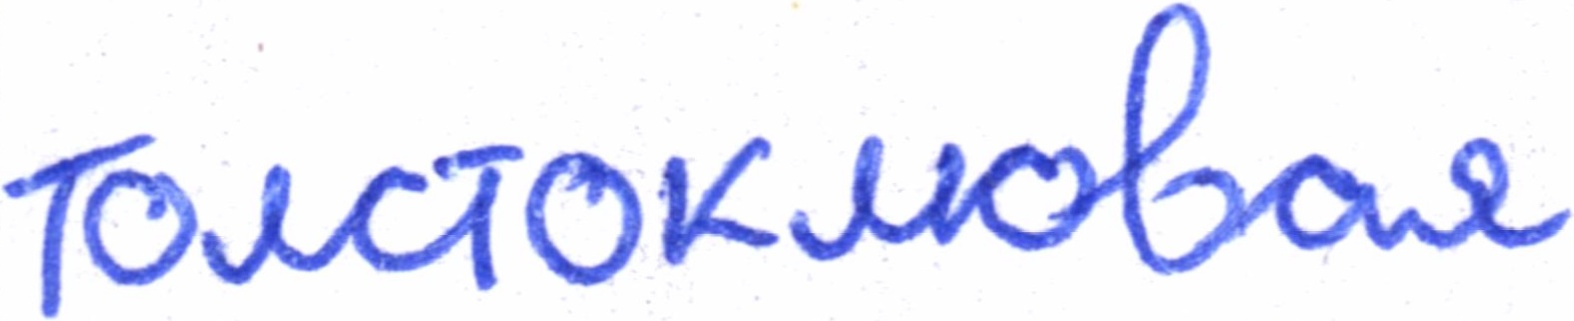толстоклювая
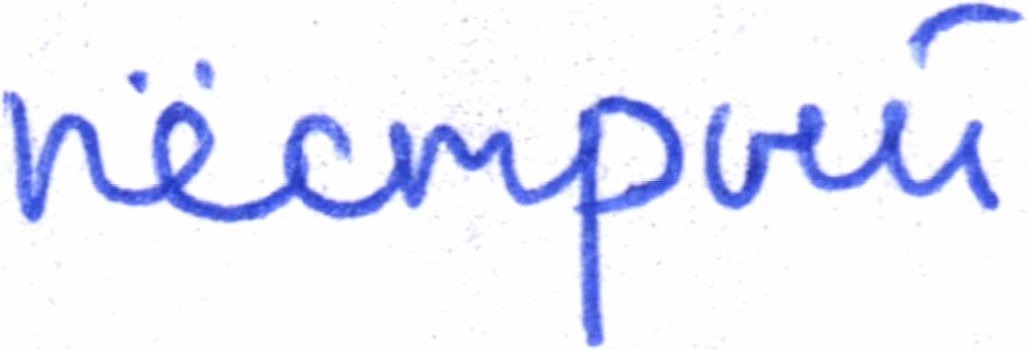пёстрый
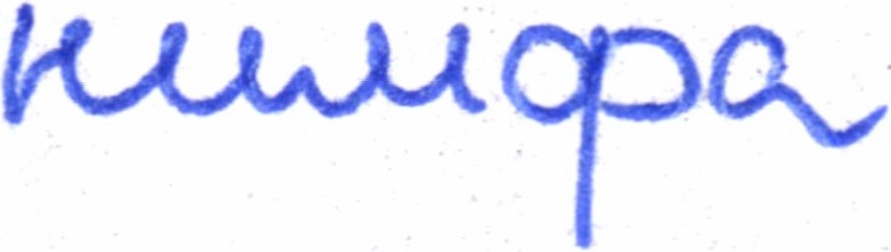нимфа
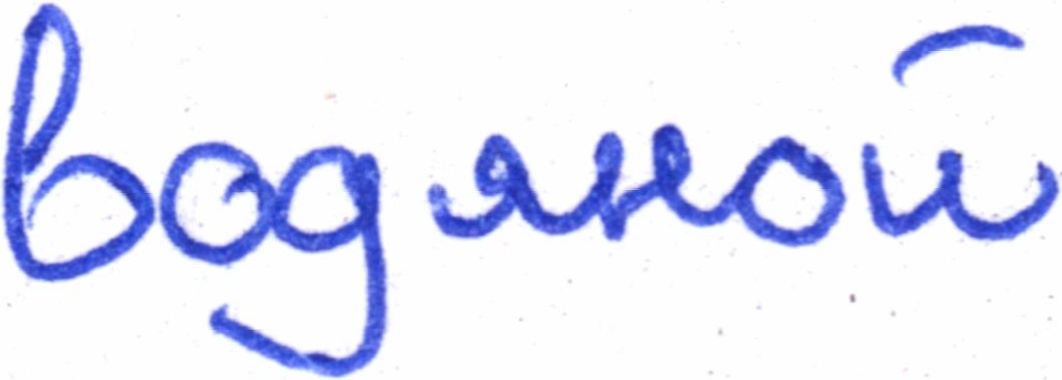водяной
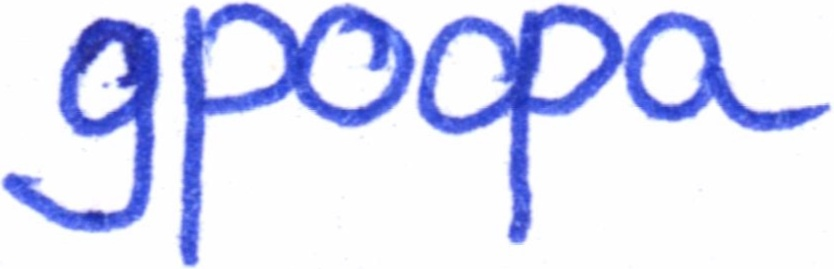дрофа
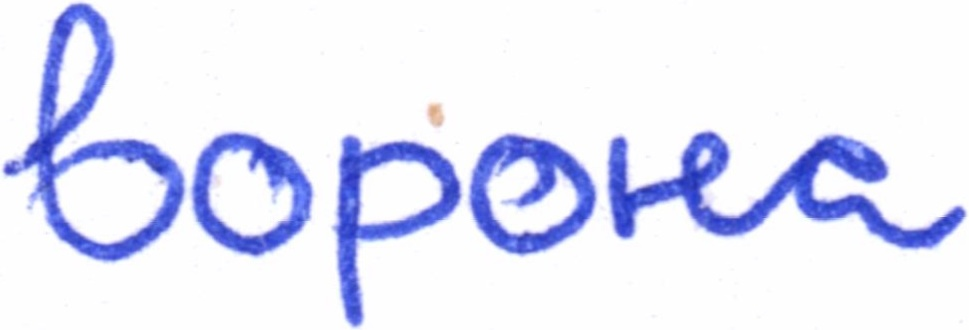ворона
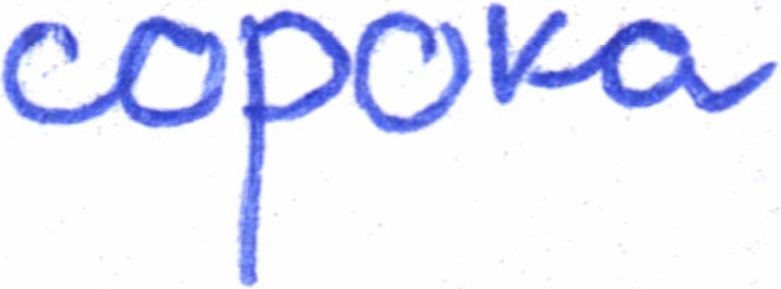сорока
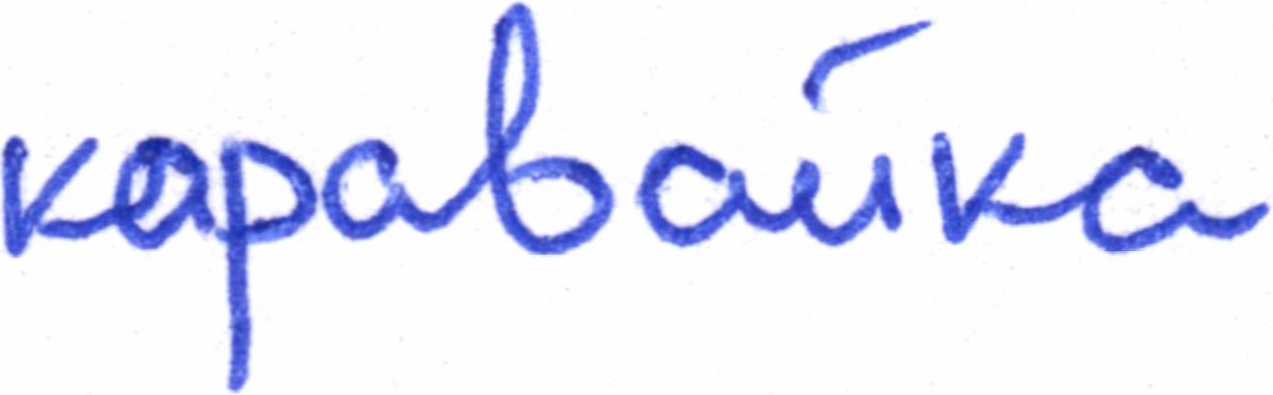каравайка
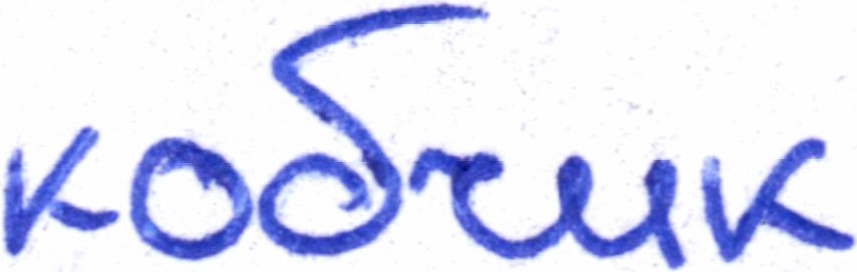кобчик
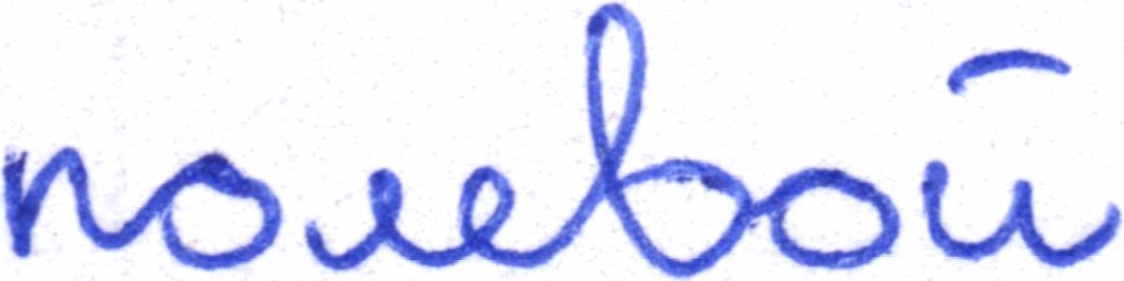полевой
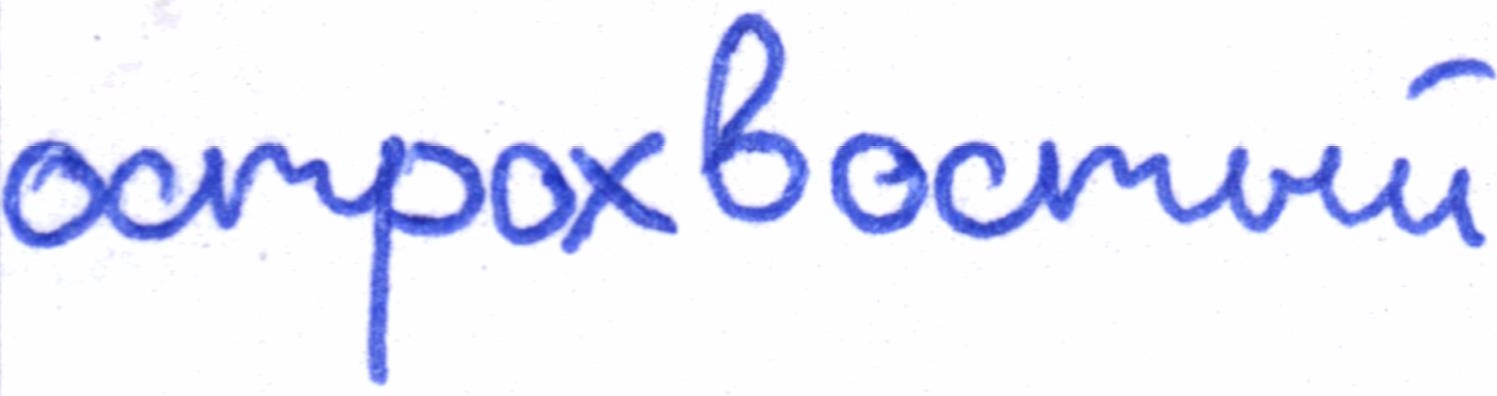острохвостый
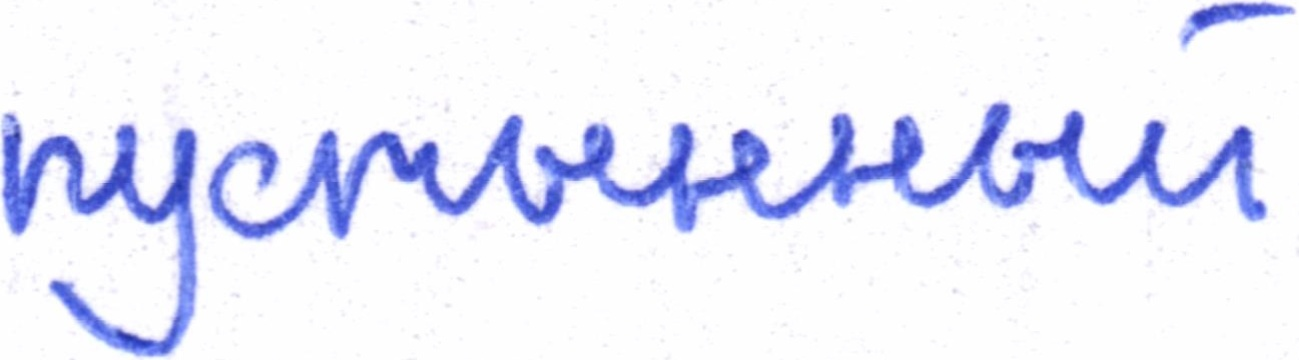пустынный
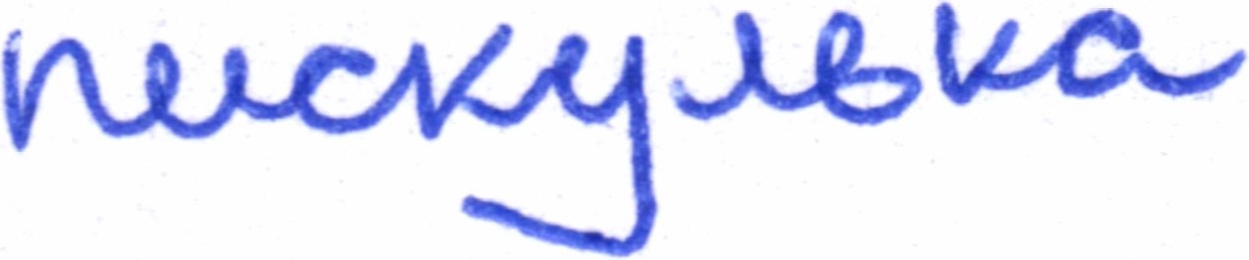пискулька
